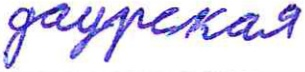даурская
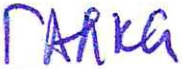галка
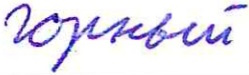горный
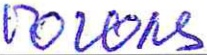гоголь
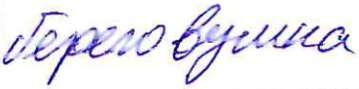береговушка
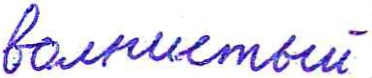волнистый
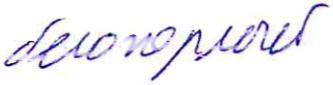белопорлый
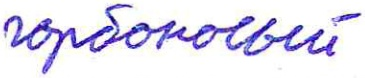горбоносый
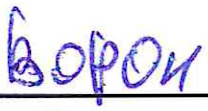ворон
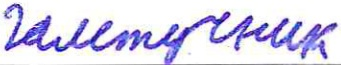галстучник
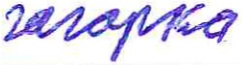гагарка
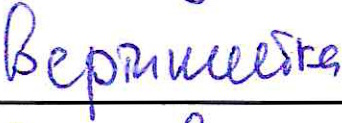вертишейка
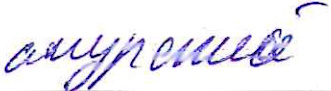амурский
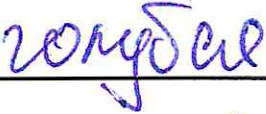голубая
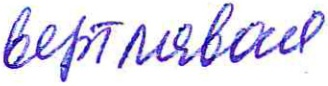вертлявая
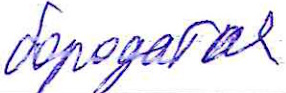бородатая
